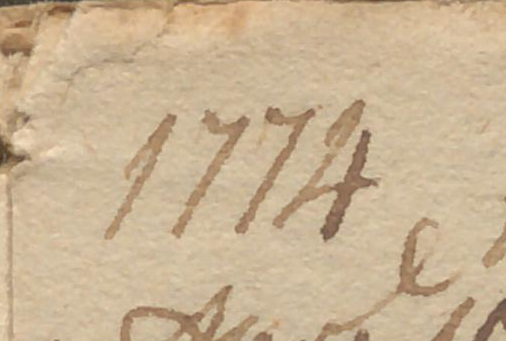1774
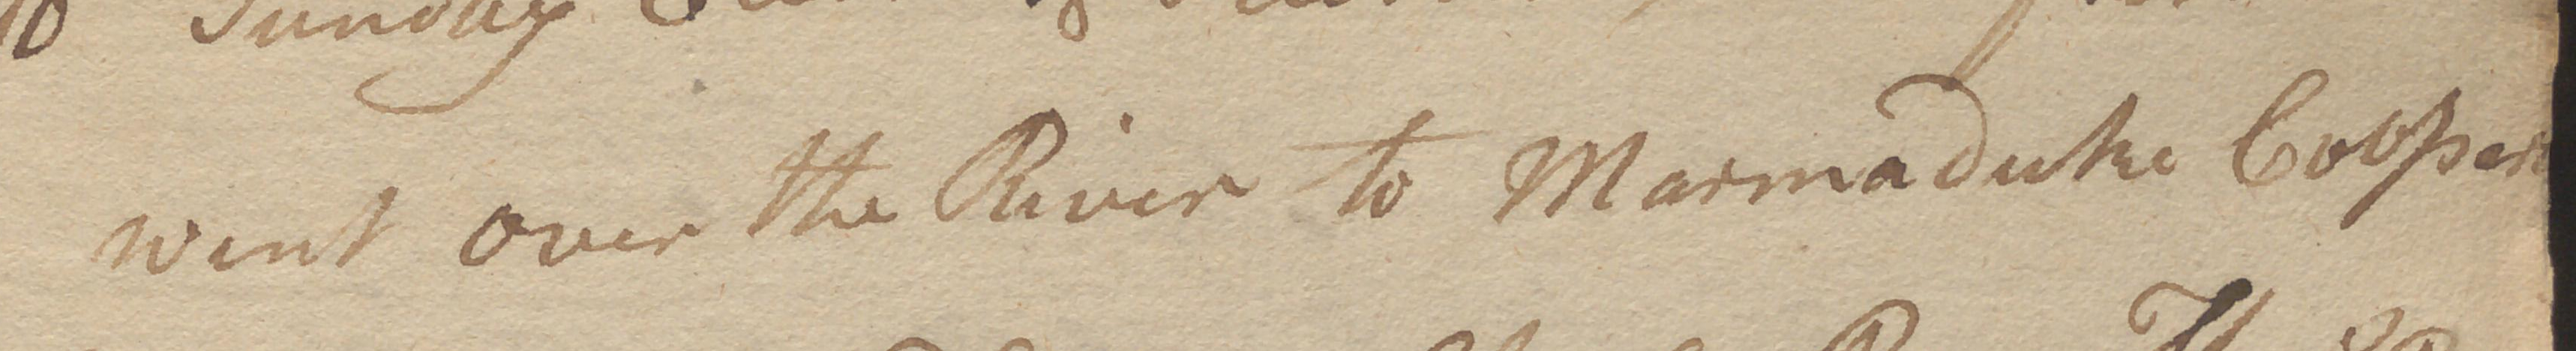went over the River to Marmaduke Cooper
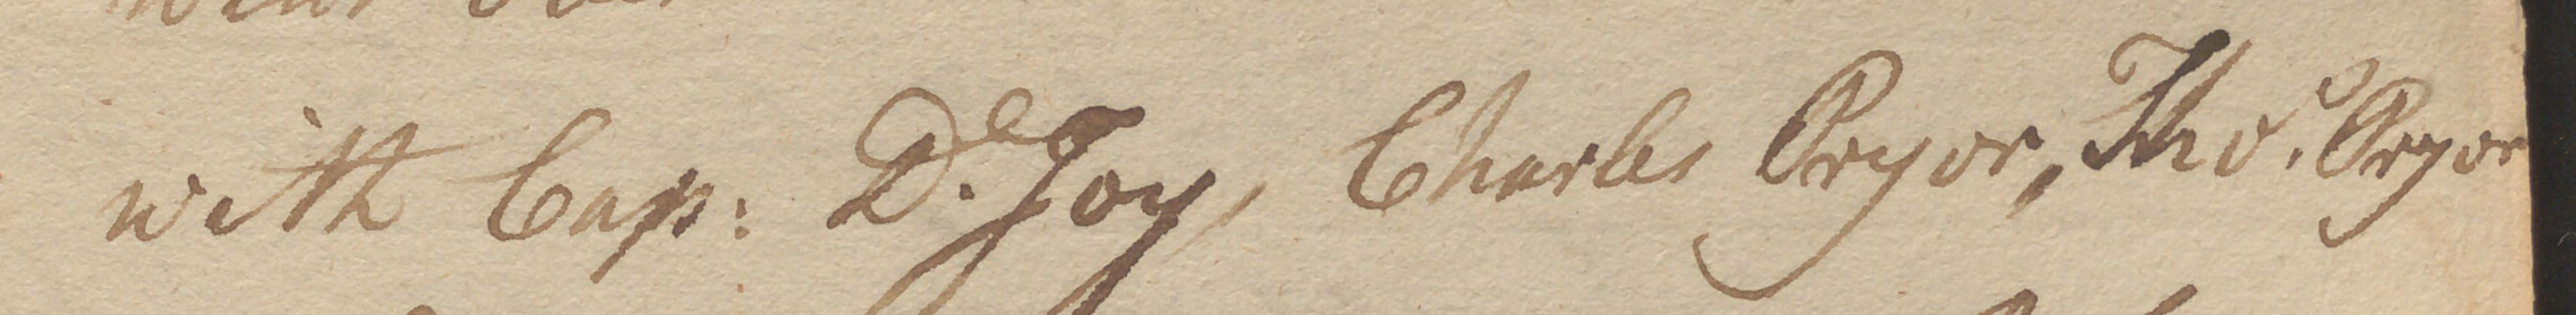with Cap. D^l. Joy, Charles Pryor, Tho^s. Pryor
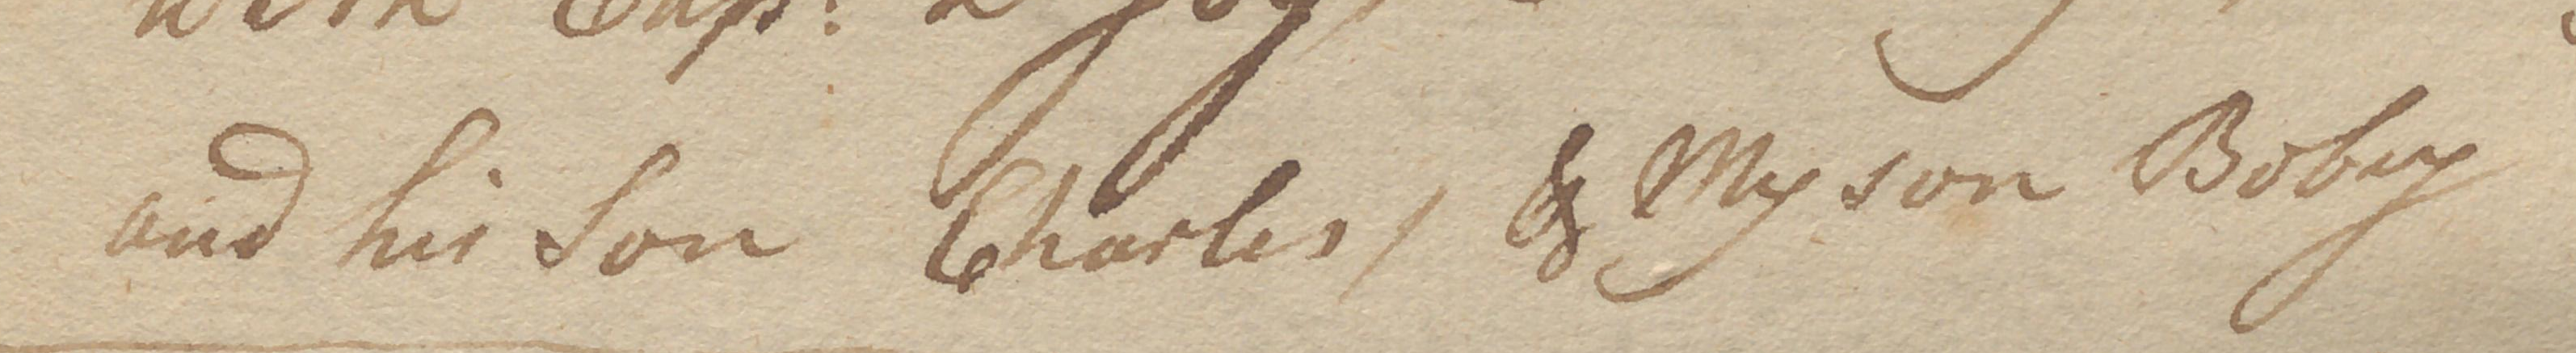and his son Charles, & My son Bobey
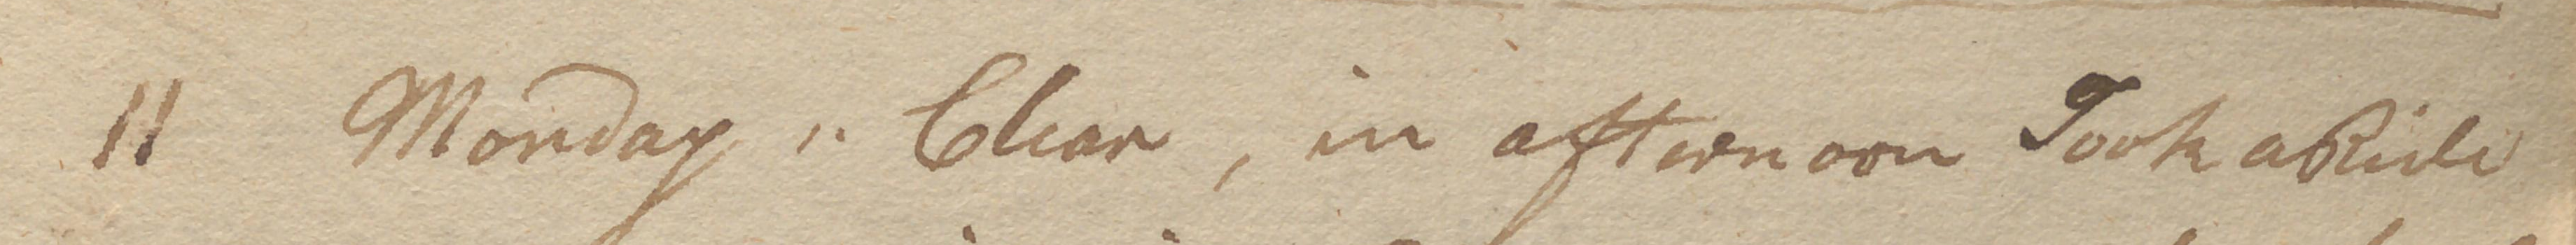11 Monday. Clear, in afternoon Took a Ride
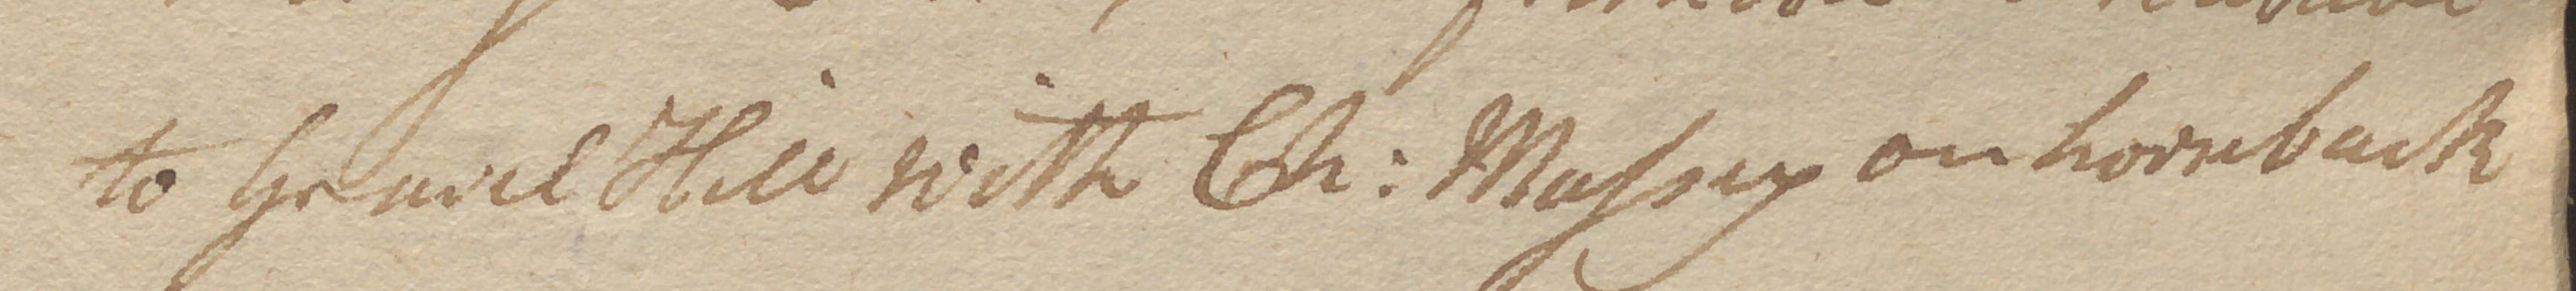to Gravel Hill with Ch: Massey on horseback
